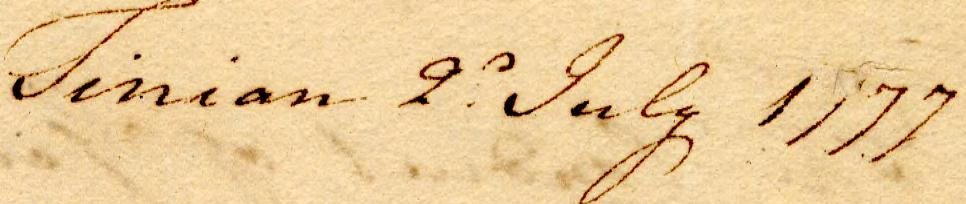Tinian 2^d. July 1777
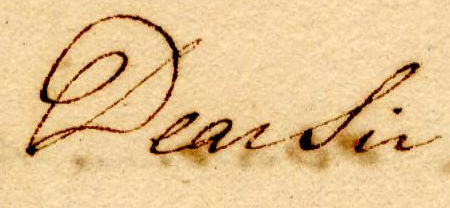Dear Sir
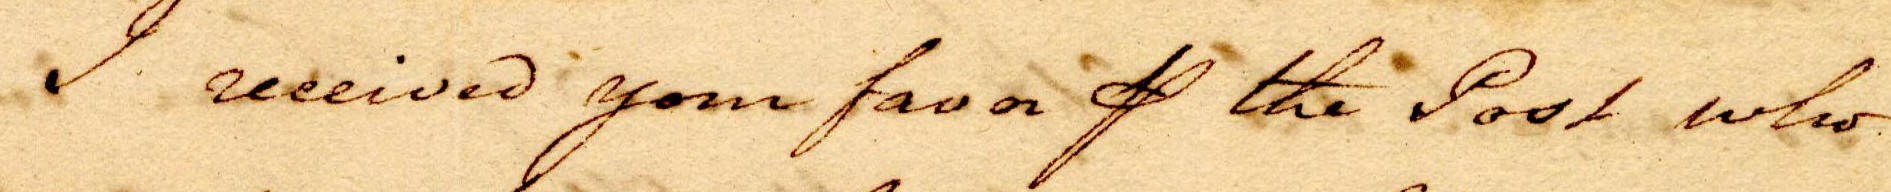I received your favor per the Post who
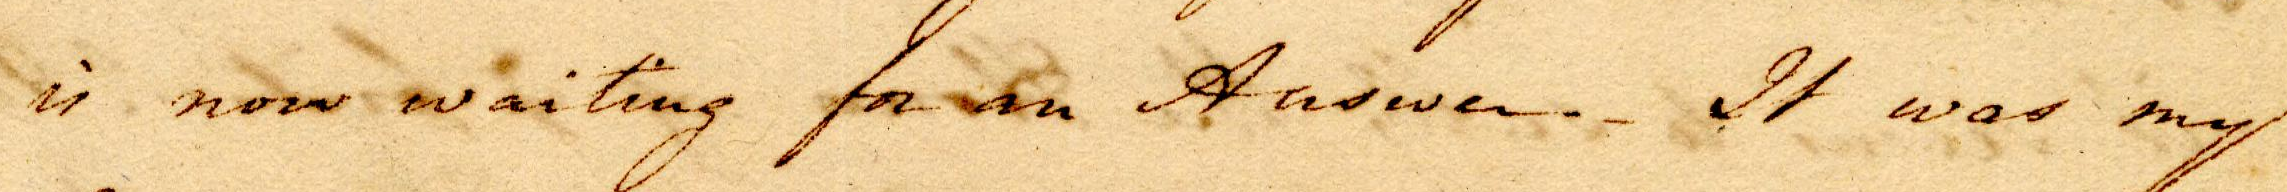is now waiting for an Answer.- It was my
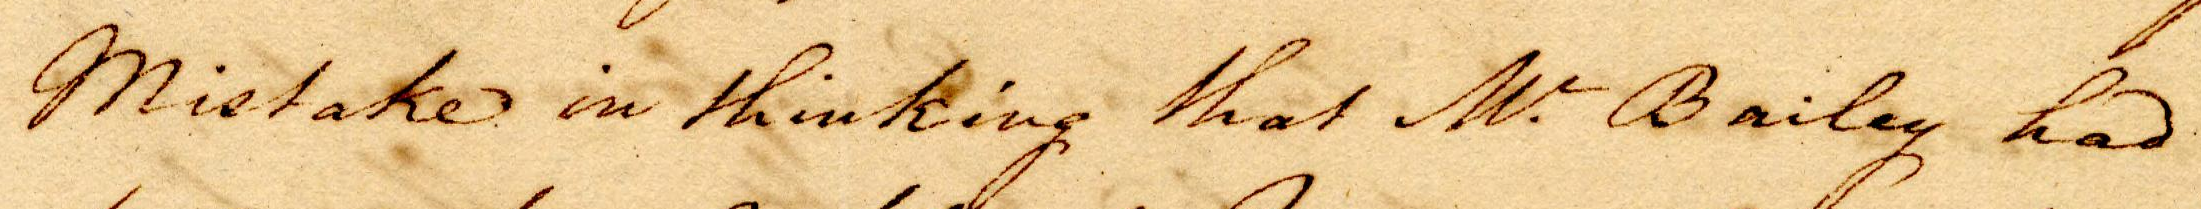Mistake in thinking that M^r. Bailey had
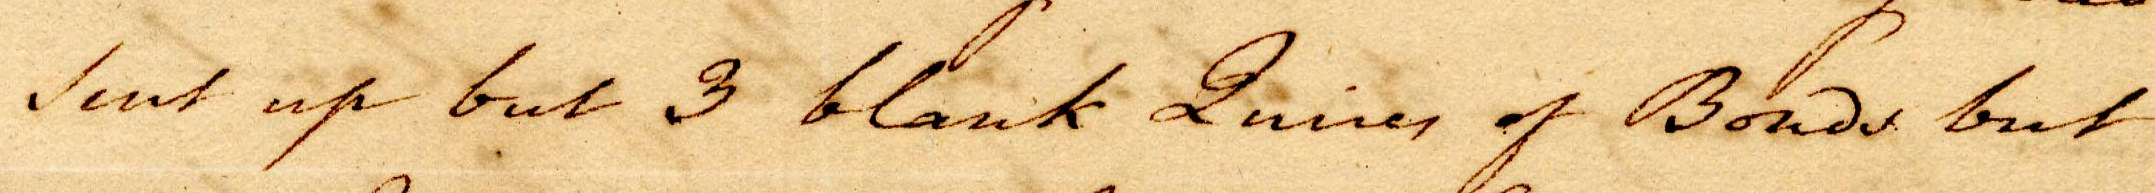sent up but 3 blank Quires of Bonds but
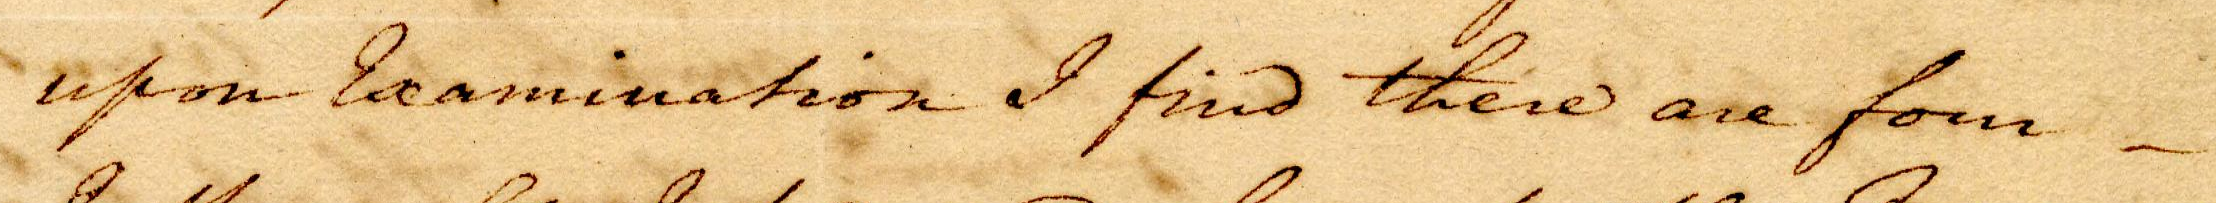upon Examination I find there are four-
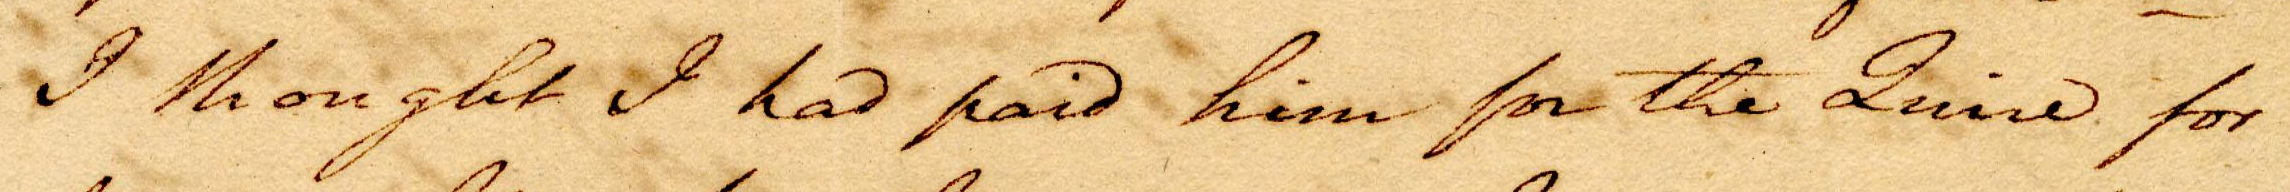I thought I had paid him for the Quire for
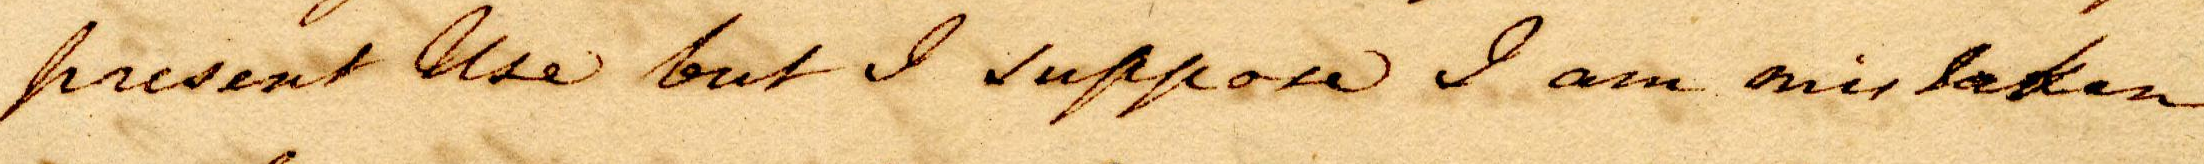present Use but I suppose I am mistaken
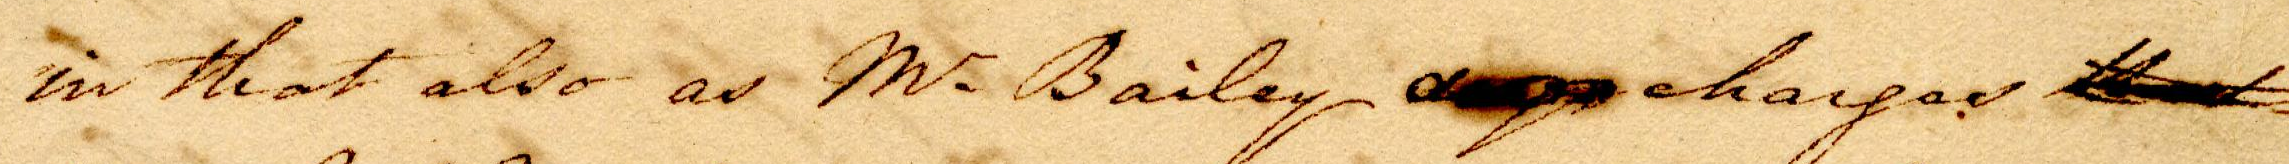in that also as M^r. Bailey [__] charges [that]
